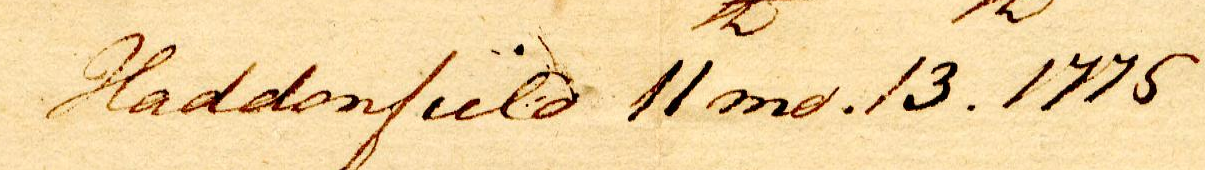Haddonfield 11^th mo. 13^th. 1775
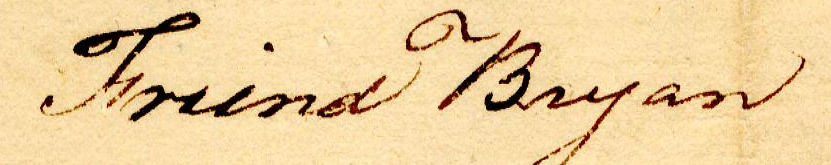Friend Bryan
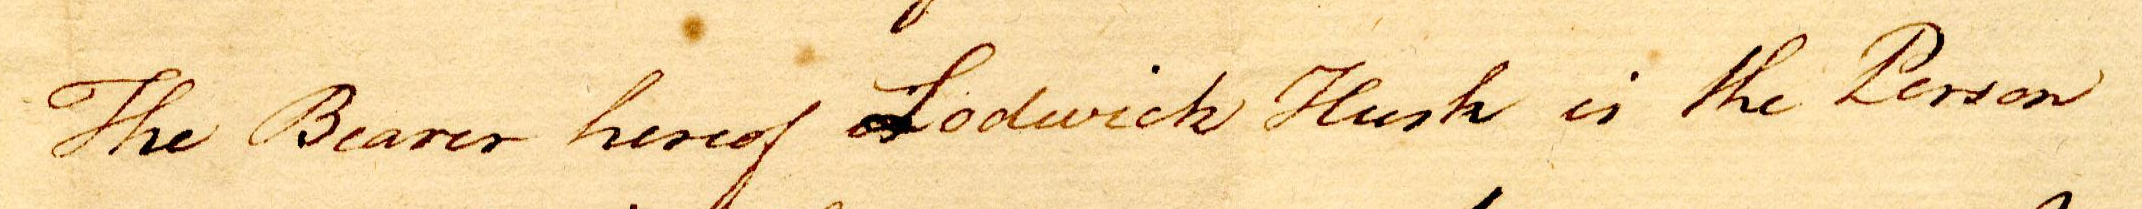The Bearer hereof of Lodwick Hush is the Person
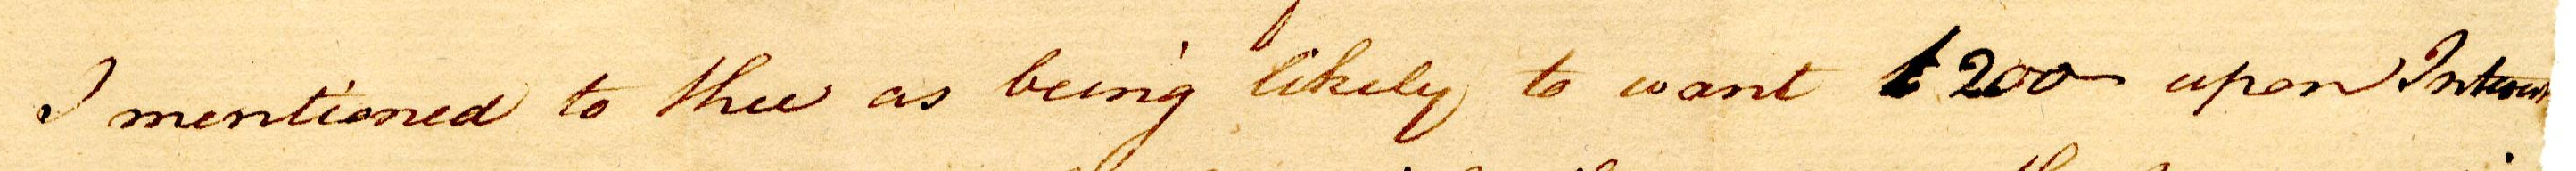I mentioned to thee as being likely to want £200 upon Instance
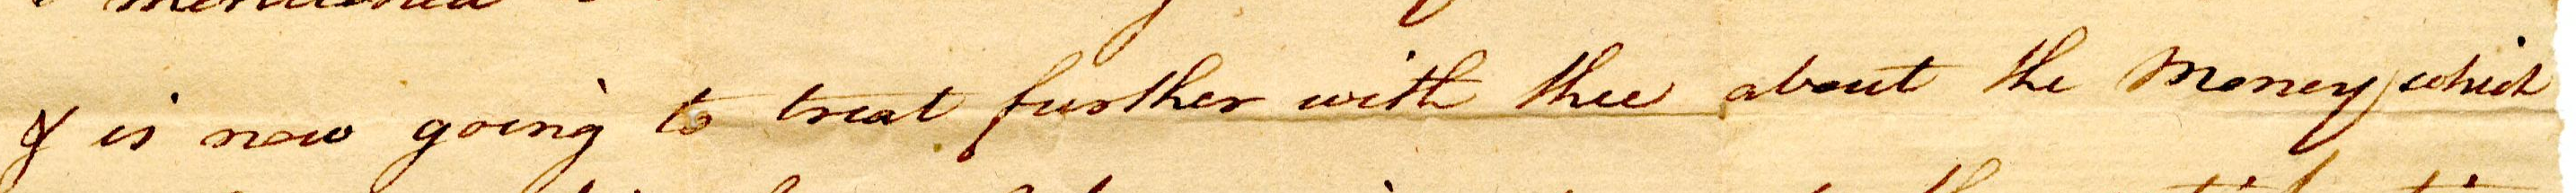& is now going to treat further with thee about the money which
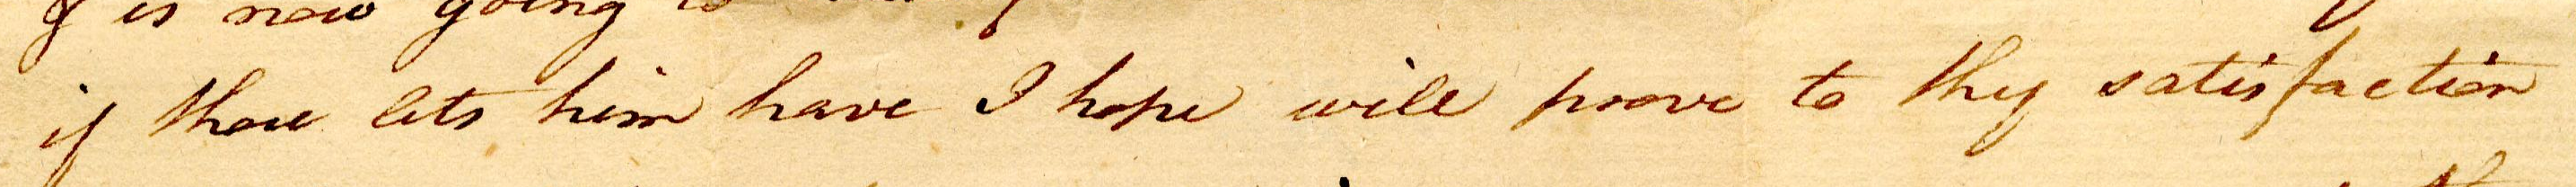if thou lets him have I hope will prove to thy satisfaction
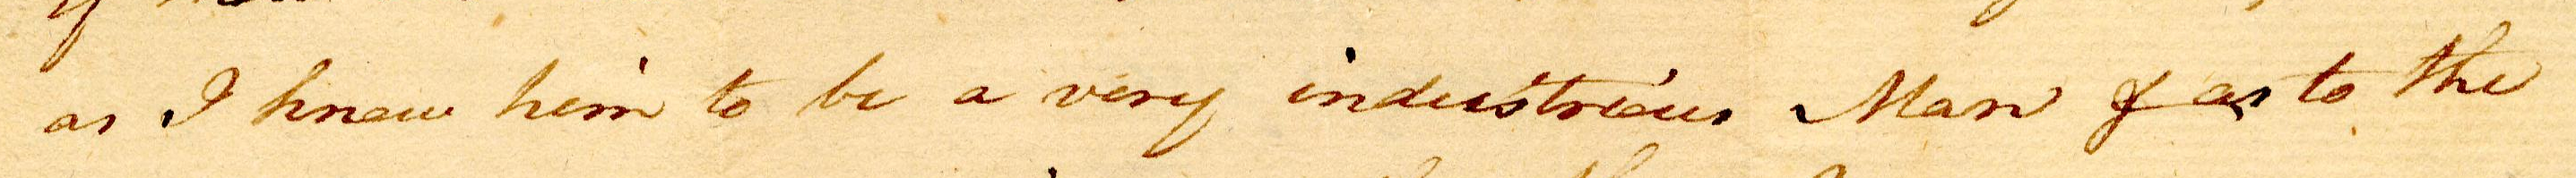as I know him to be a very industrious Man & as to the
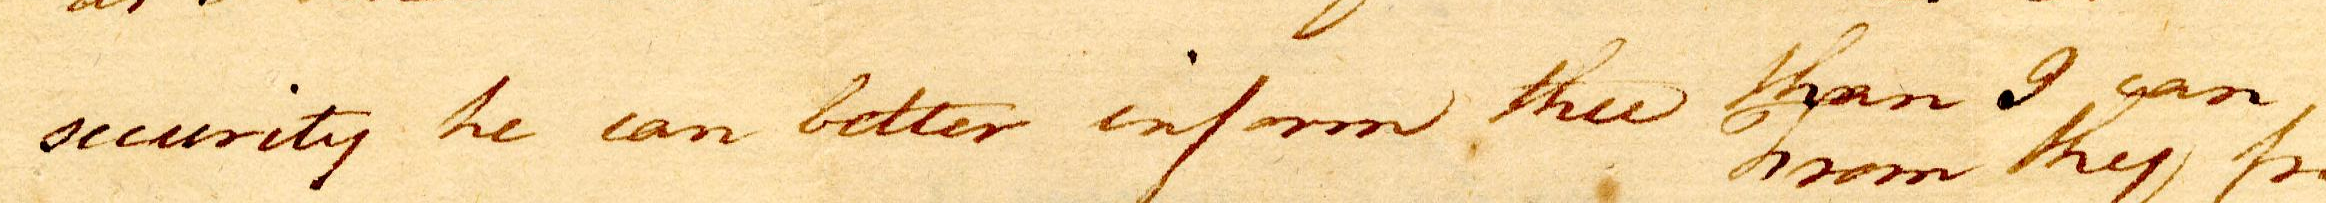security he can better inform thee than I can
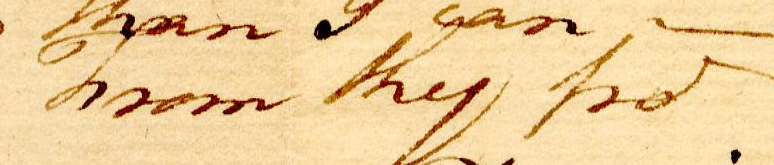From thy po
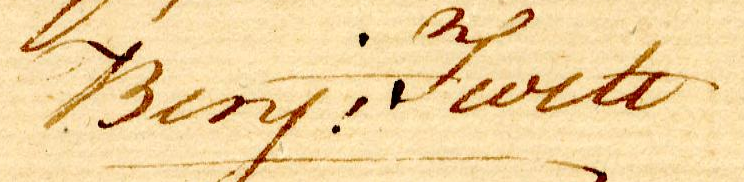Benj. Twite
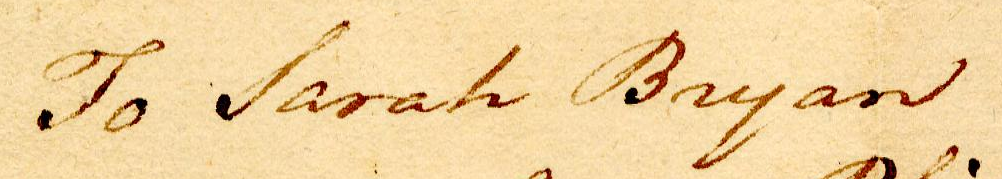To Sarah Bryan
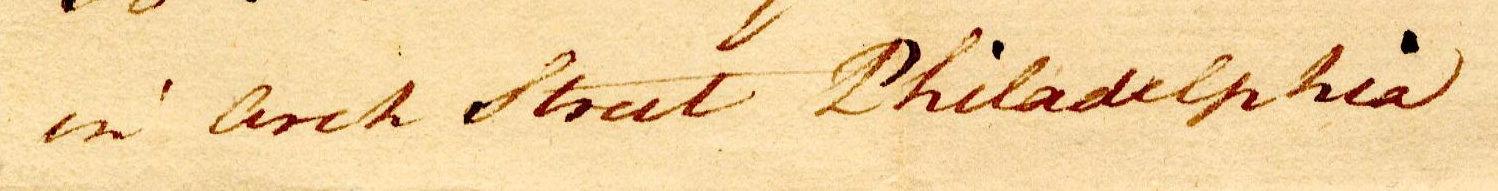in Arch street Philadelphia
